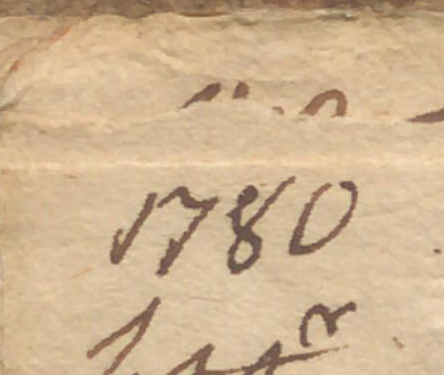1780
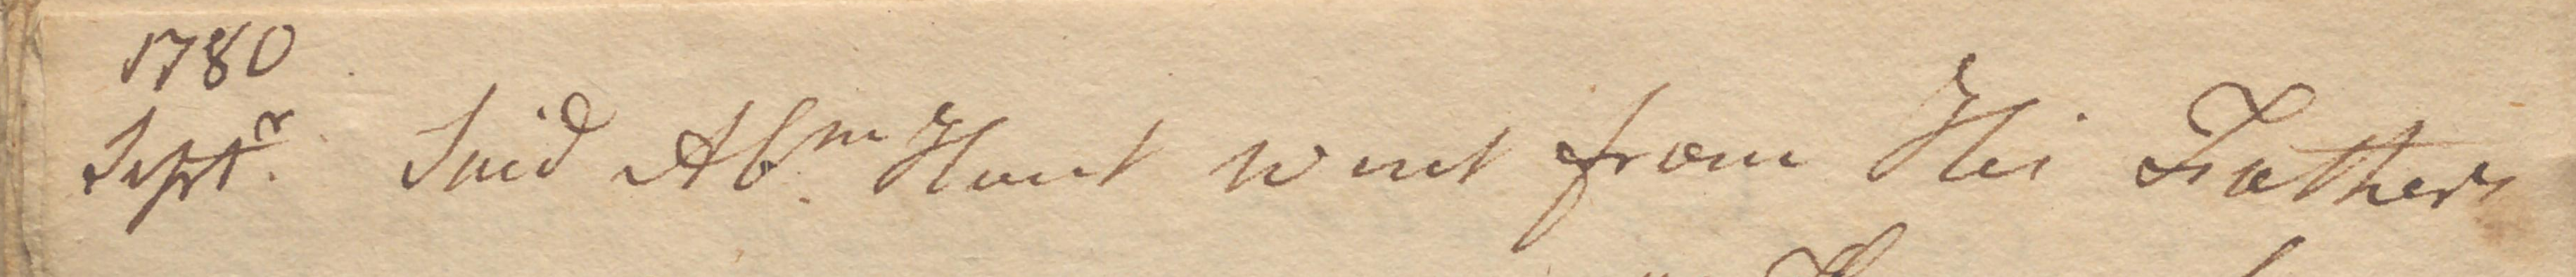Sept^r. Said Ab^m. Hunt went from His Fathers
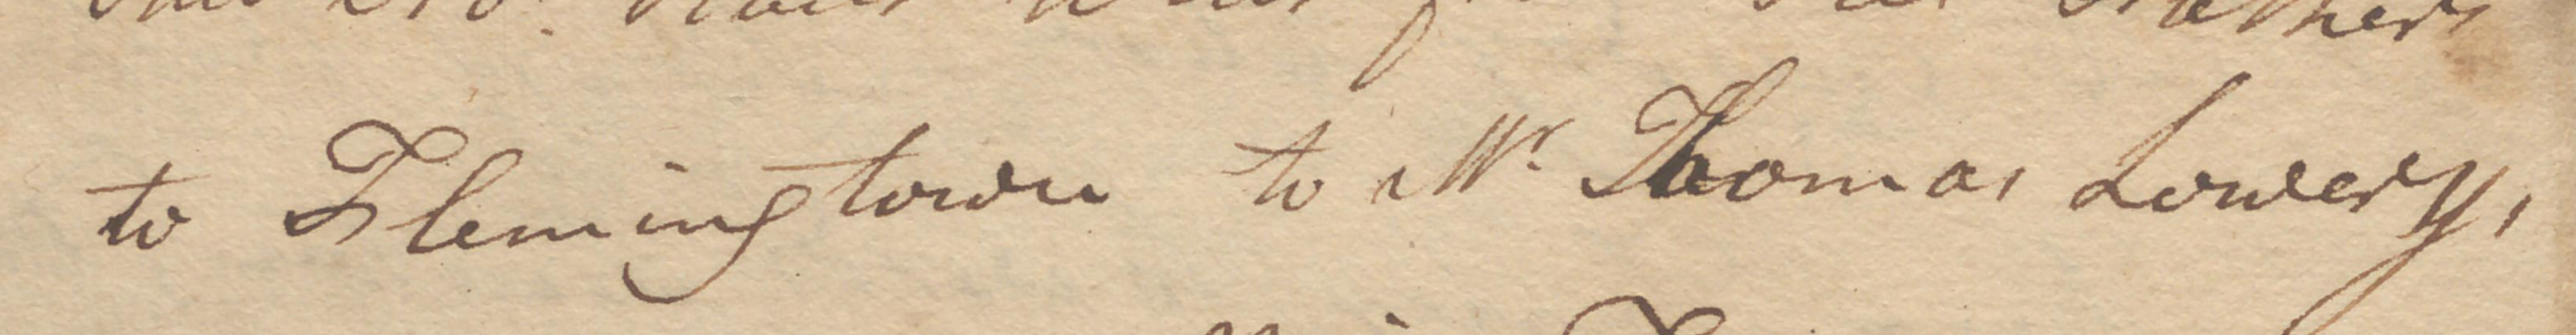to Flemingtown to M^r. Thomas Lowerys
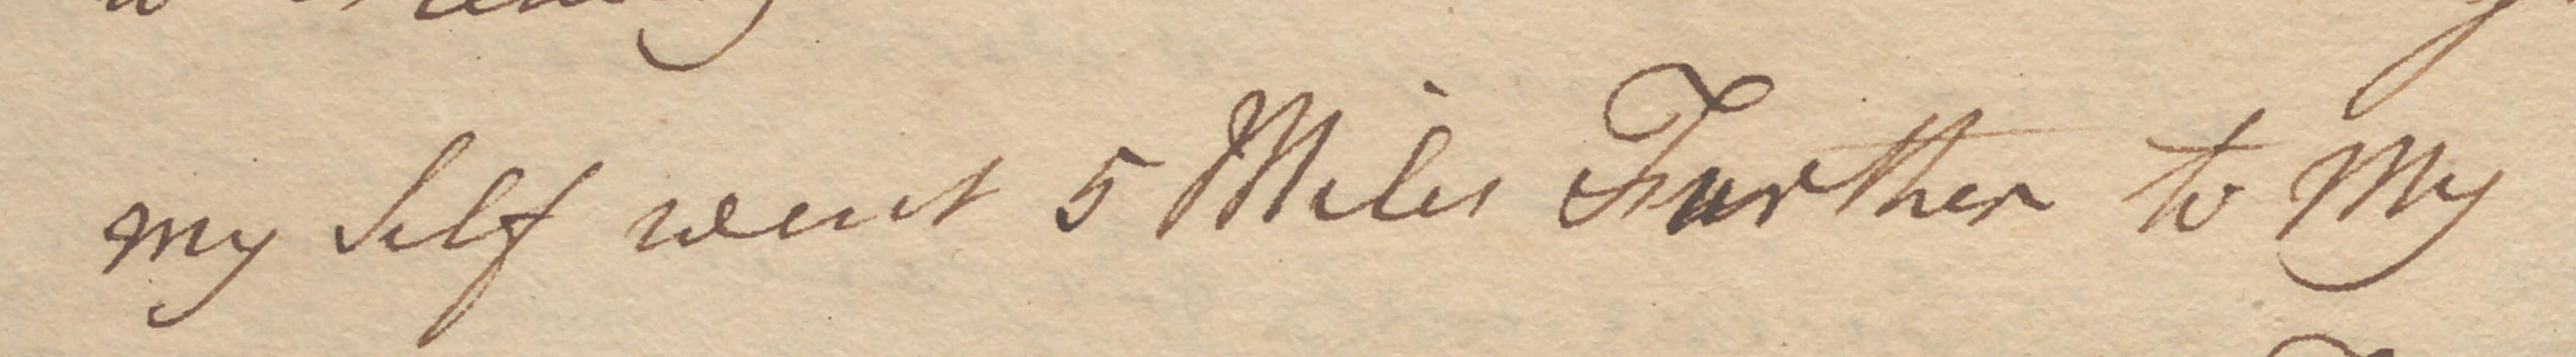my self went 5 Miles Farther to My
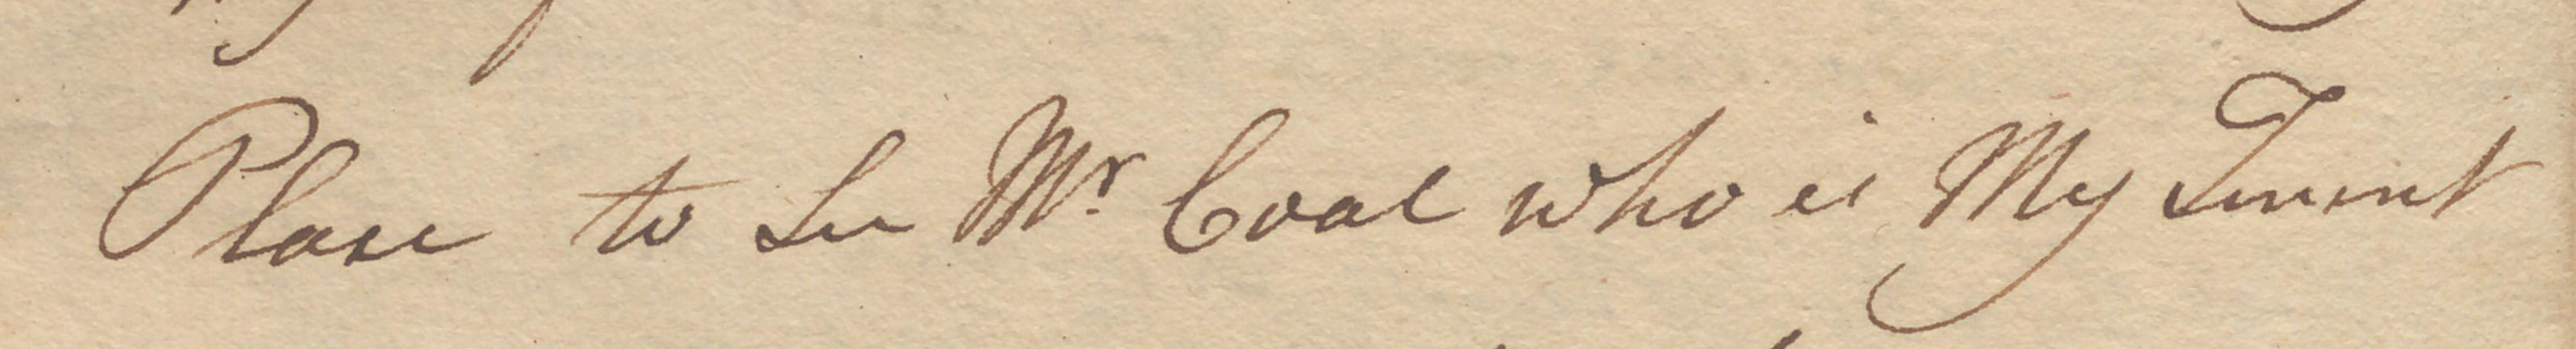Place to see M^r. Coal who is My Tenent
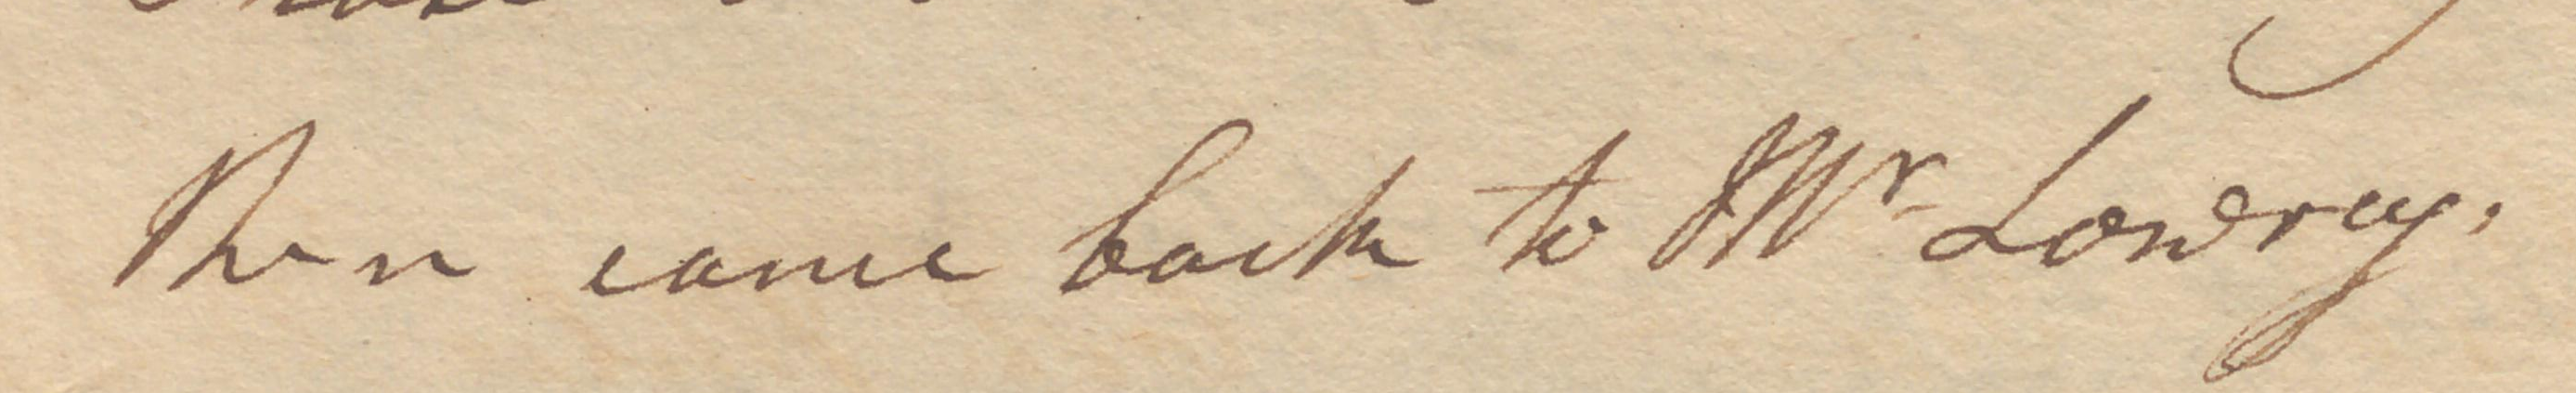then came back to M^r Lowrey.
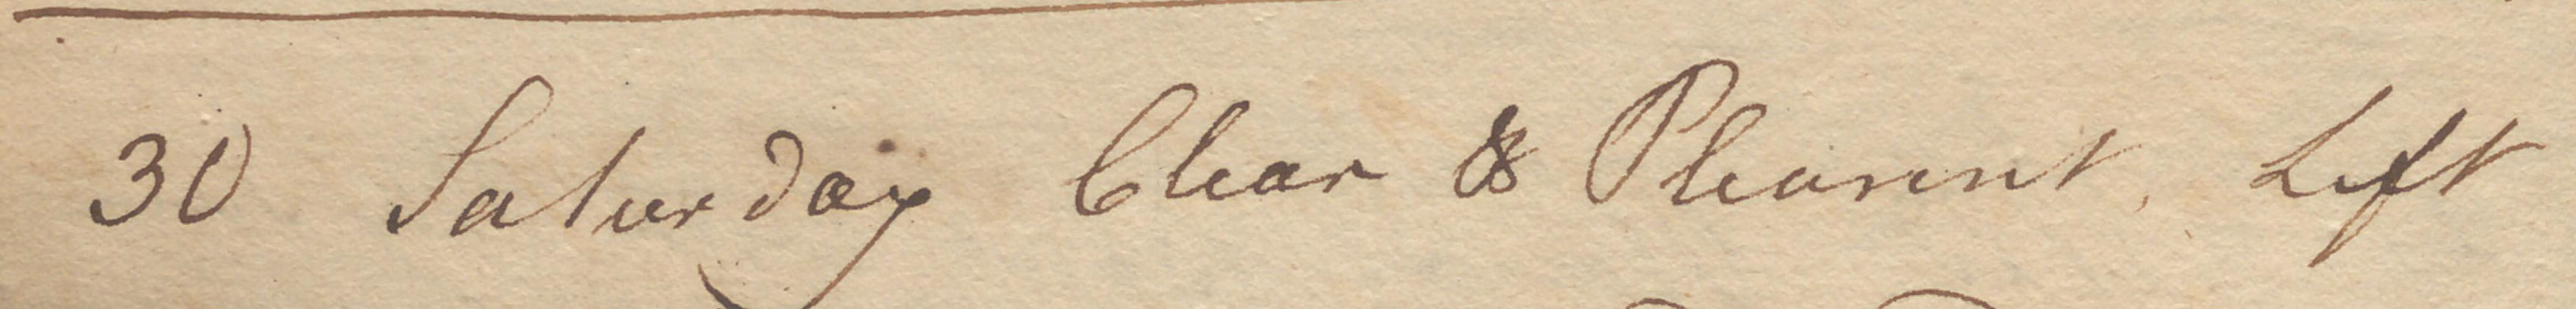30 Saturday Clear & Pleasent, left
